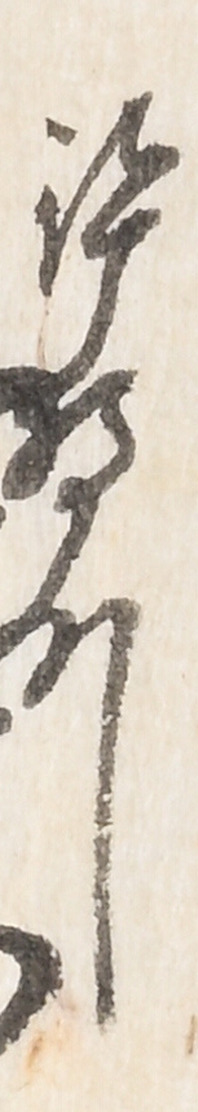鉾持町
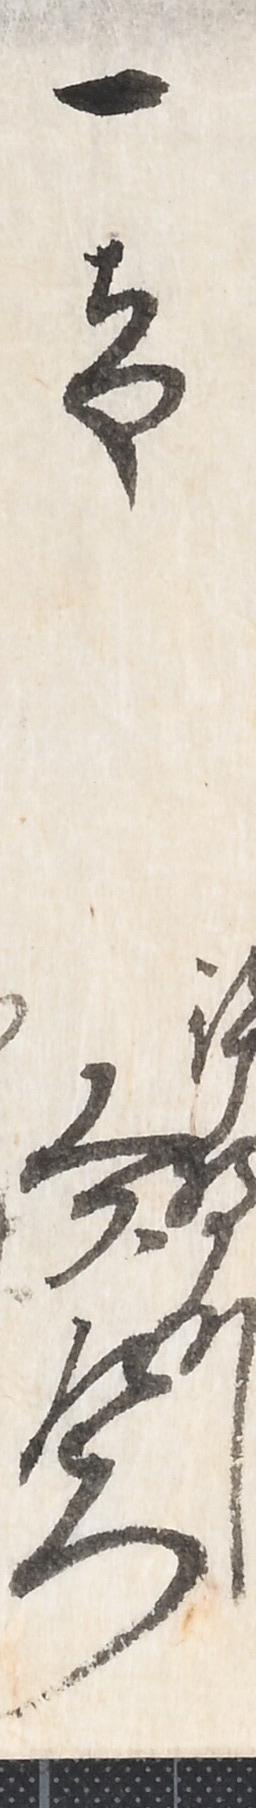一ちや左衛門
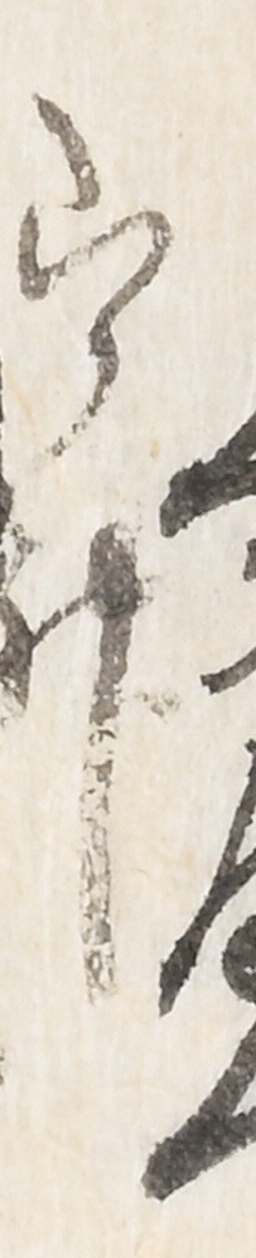山ノ神
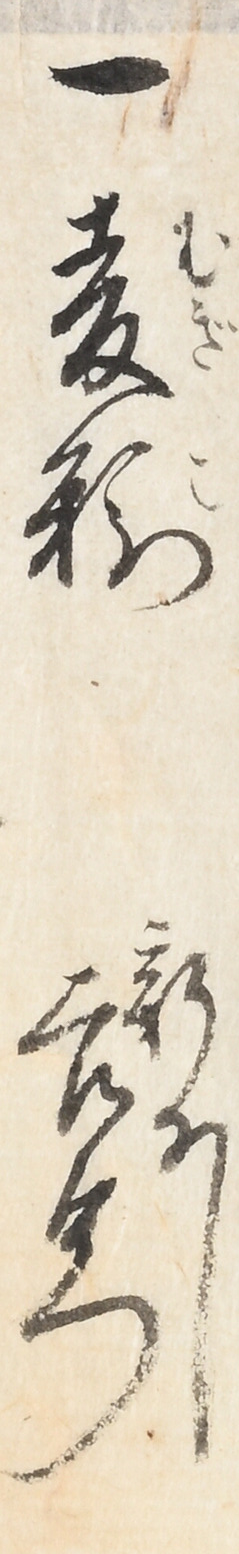一麦粉庄右衛門

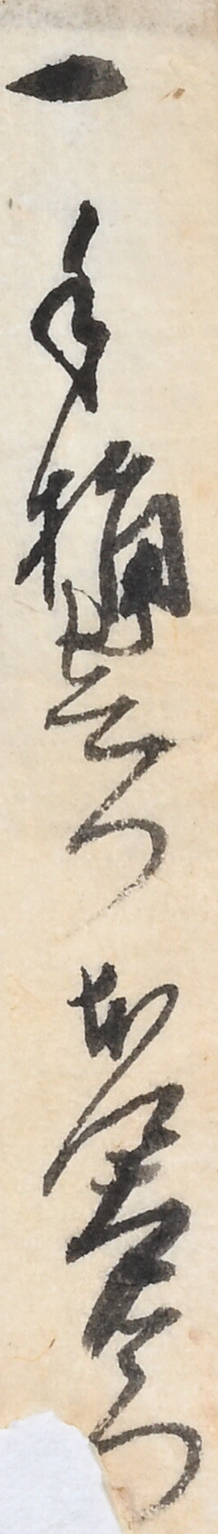一手桶壱つ本郷太右衛門
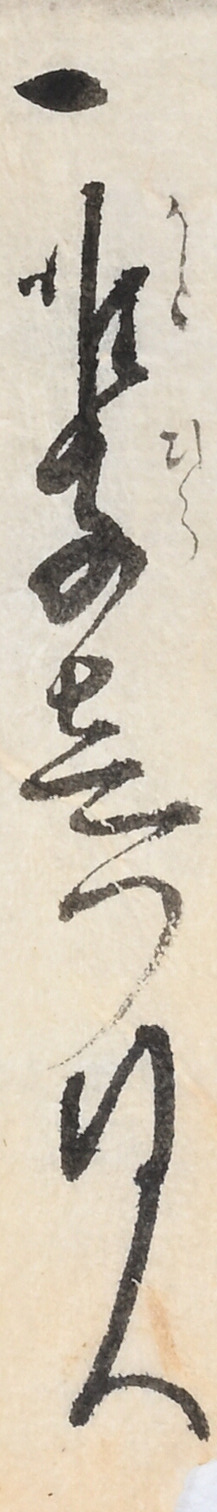一帷子壱つ同人
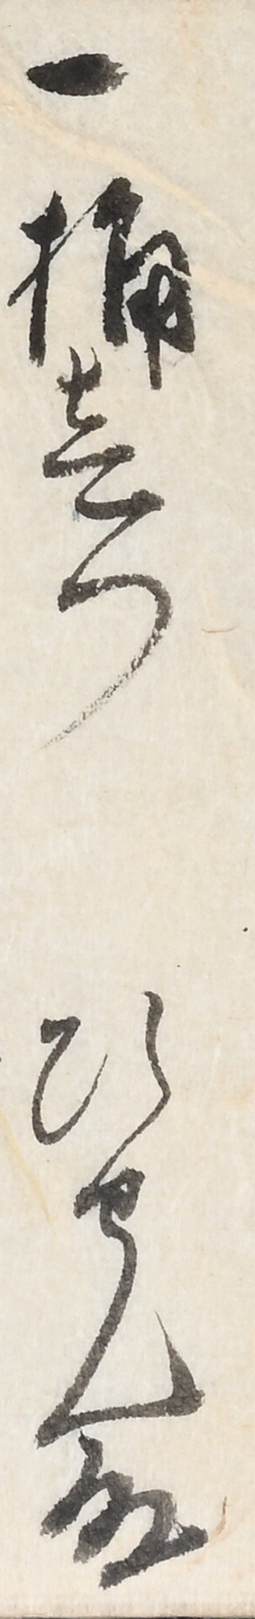一桶壱つひせん殿
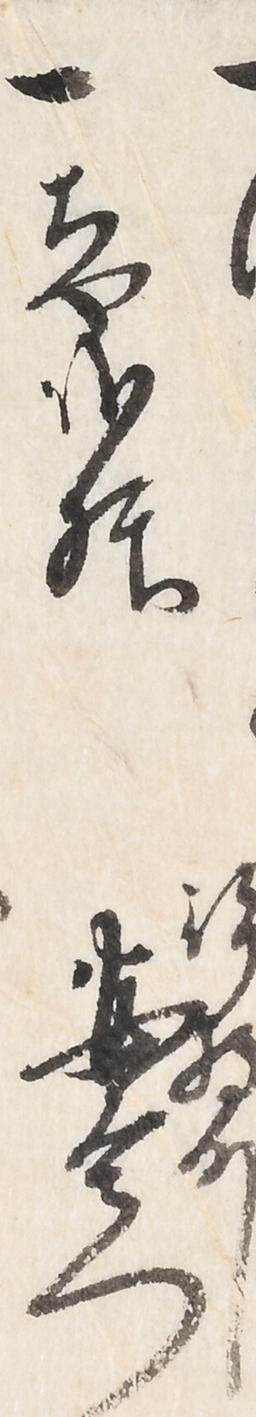一ちや弐升安左衛門
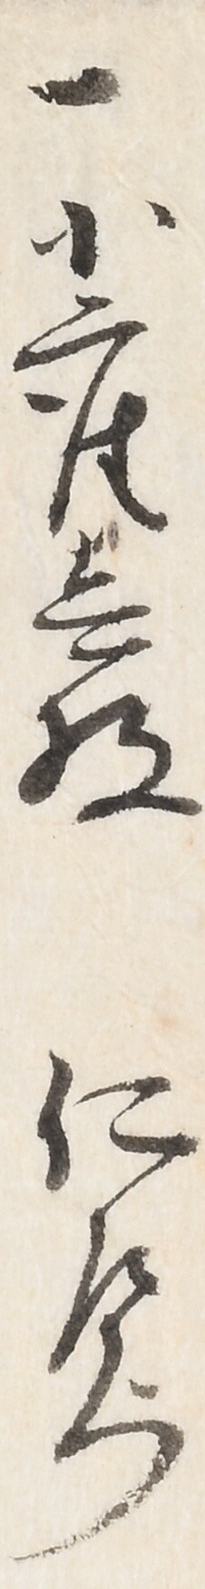一小座壱枚仁左衛門
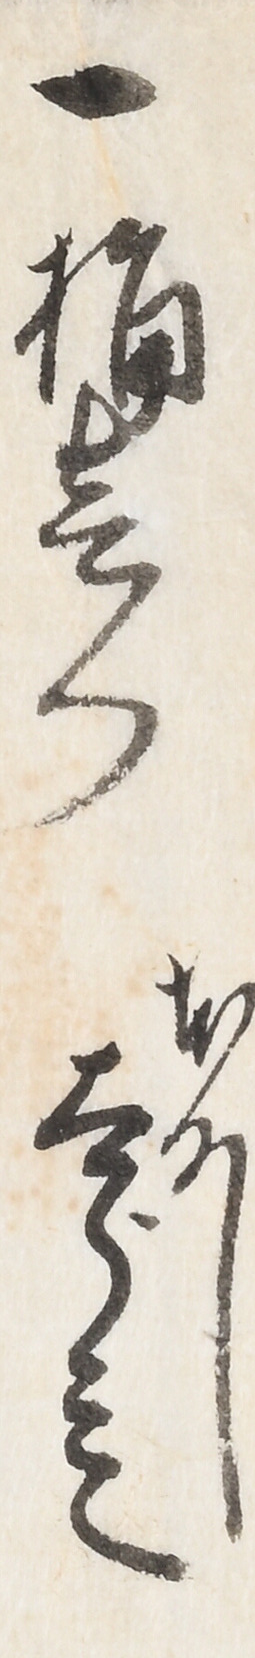一桶壱つ太郎兵衛
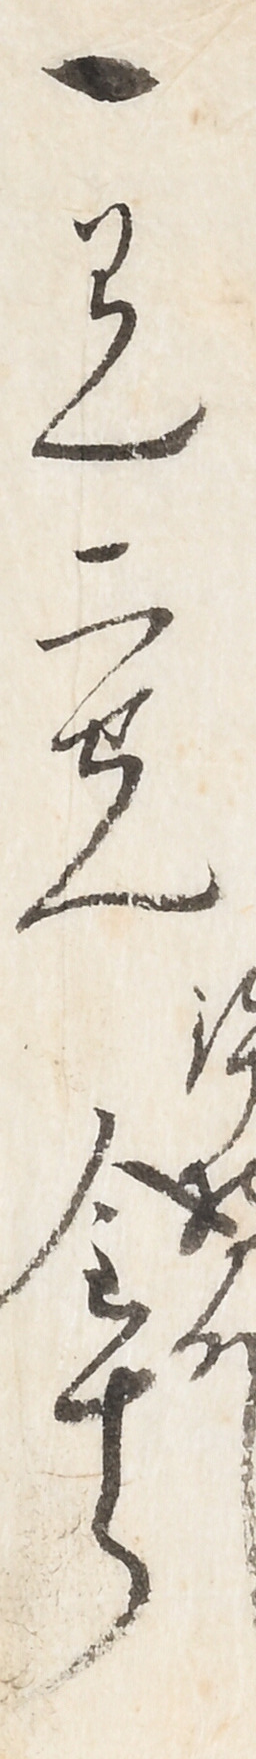一わん二せん金十郎
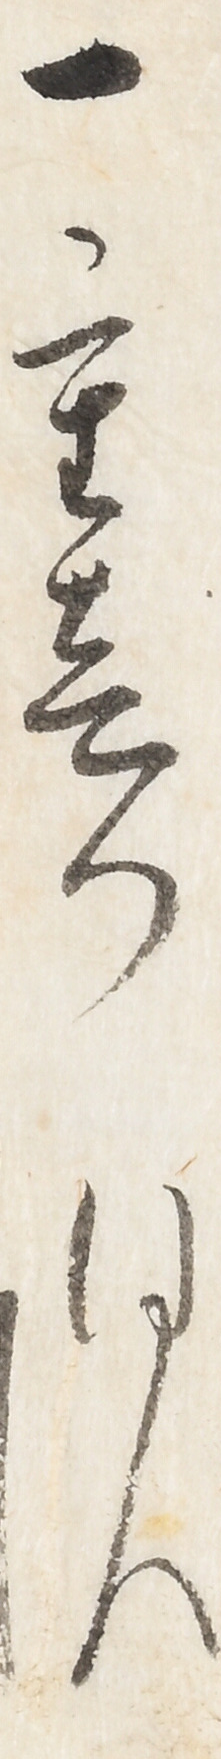一重壱つ同人
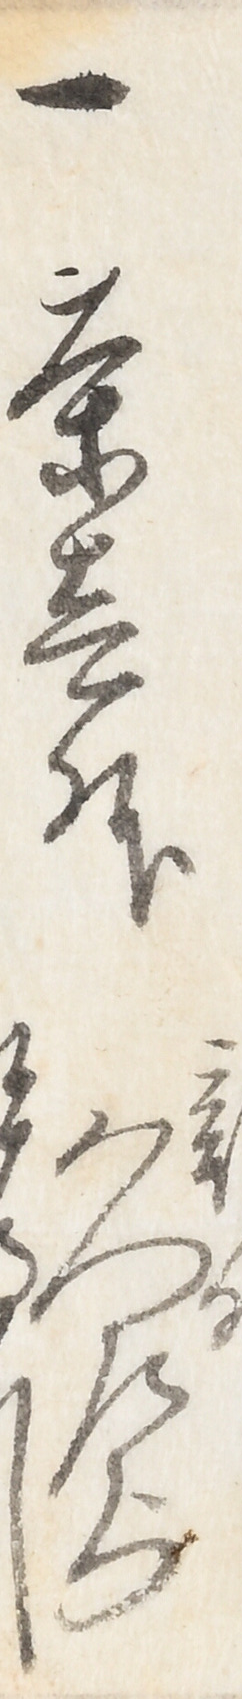一茶壱升久左衛門
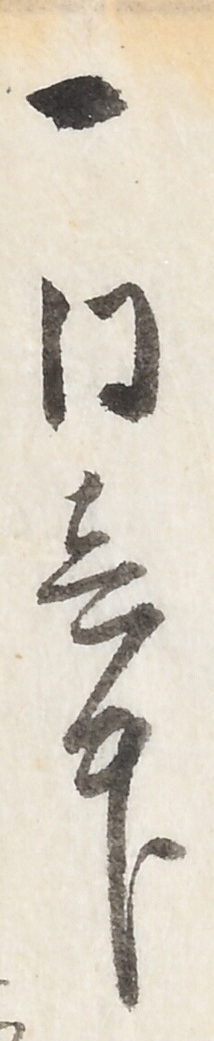一重壱つ同人
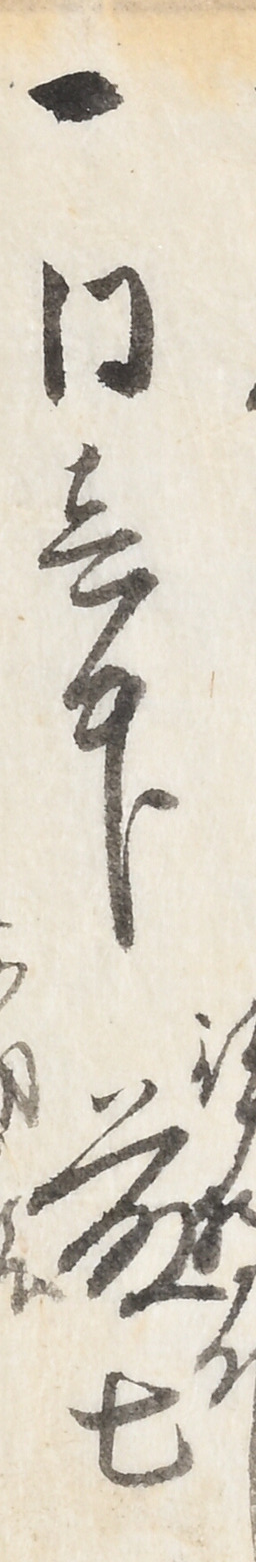一同壱升藤七
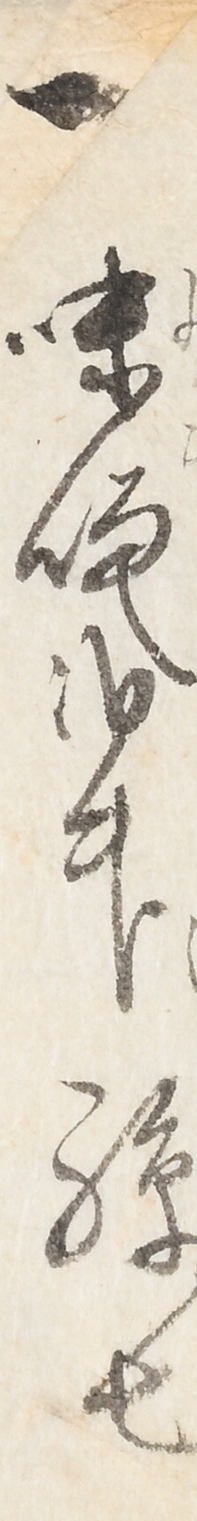一味噌弐升孫七
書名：合力覚帳
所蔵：伊那市立高遠町図書館・合同会社AMANE
